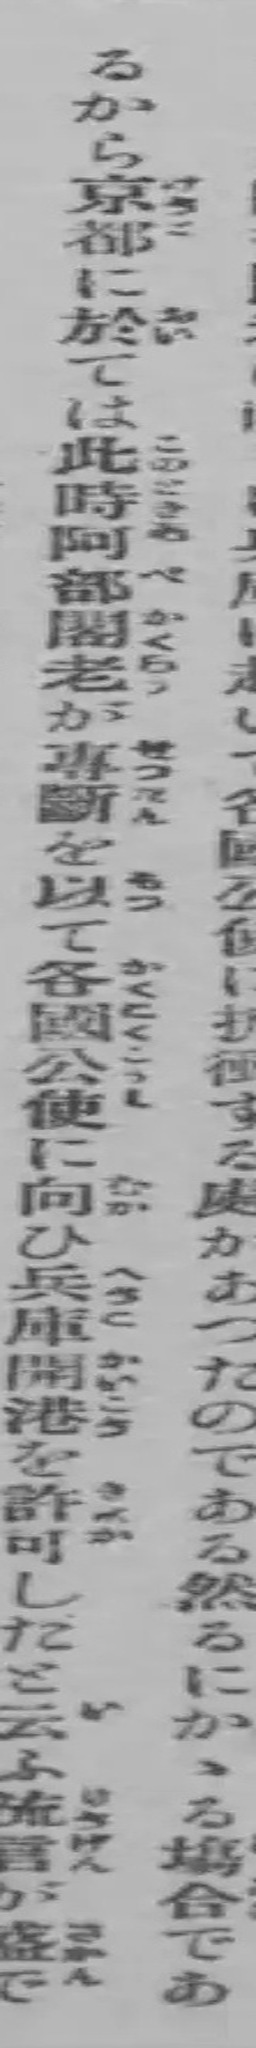るから京都に於ては此時阿部閣老が専断を以て各国公使に向ひ兵庫開港を許可したと云ふ流言が盛で
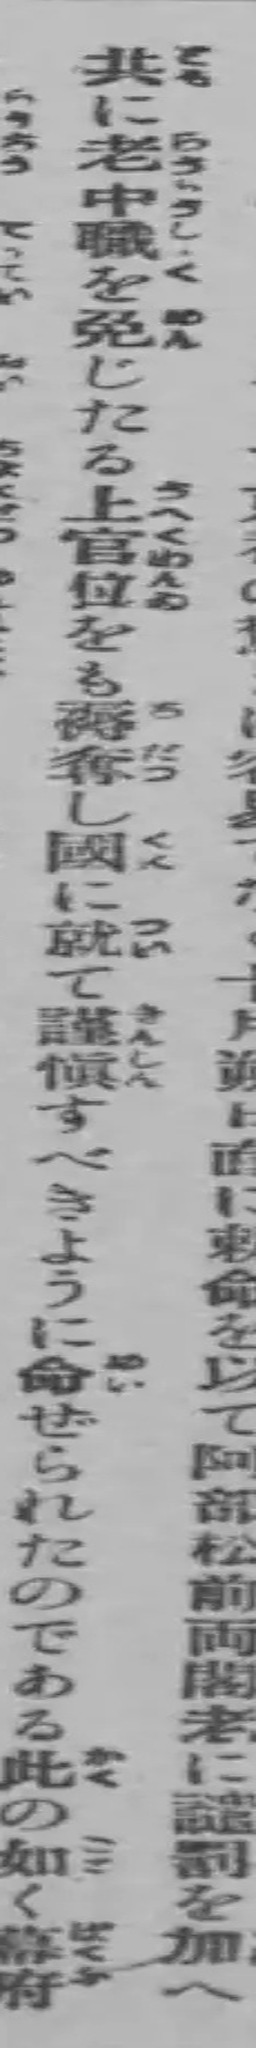共に老中職を免じたる上官位をも褥奪し国に就て謹慎すべきように命ぜられたのである此の如く幕府
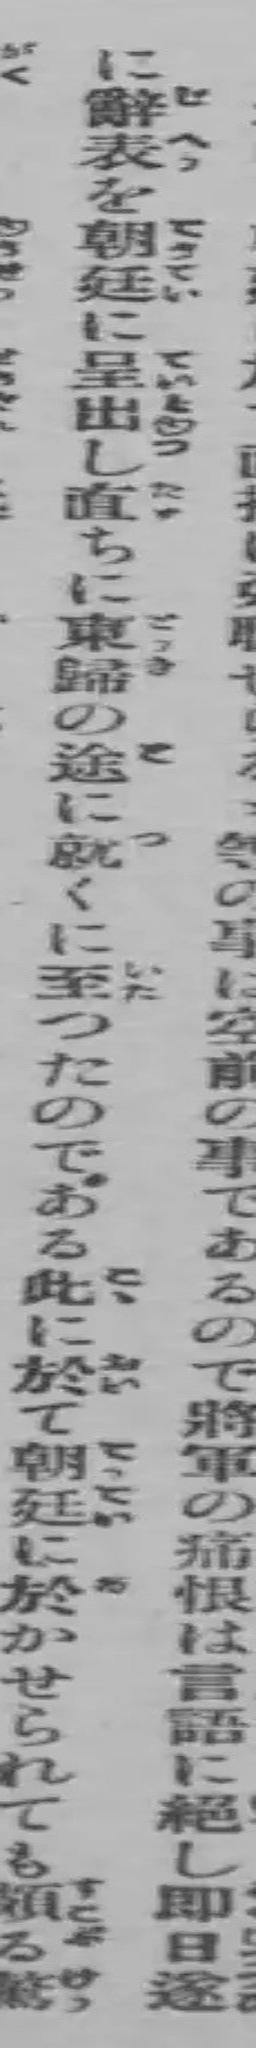に辞表を朝廷に呈出し直ちに東帰の途に就くに至つたのである此に於て朝廷に於かせられても頗る驚
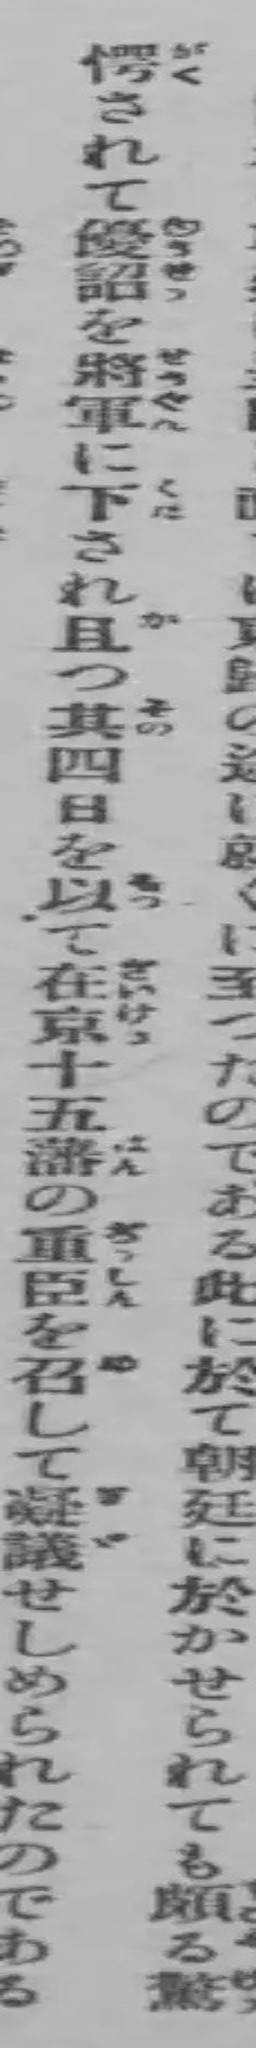愕されて優詔を将軍に下され且つ其四日を以て在京十五藩の重臣を召して疑議せしめられたのである
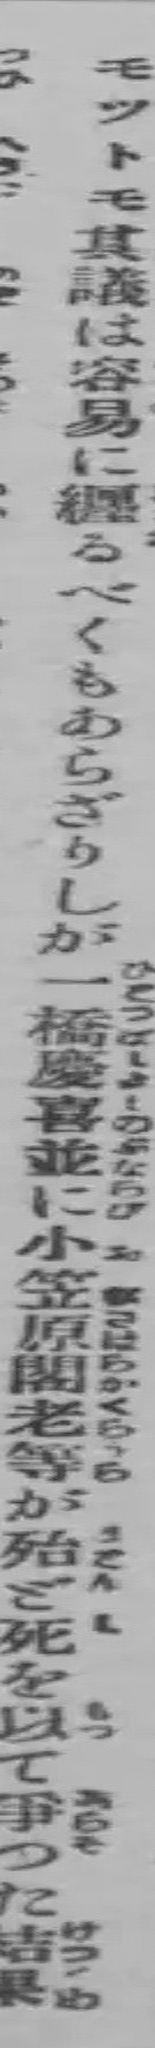モツトモ其議は容易に纏るべくもあらざりしが一橋慶喜並に小笠原閣老等が殆ど死を以て争つた結果
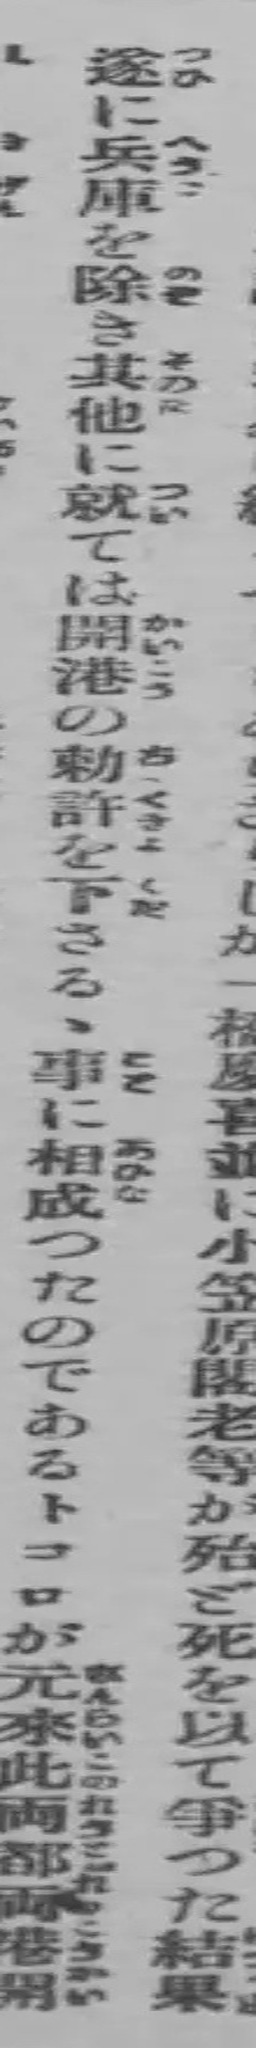遂に兵庫を除き其他に就ては開港の勅許を下さるゝ事に相成つたのであるトコロが元来此両都両港開
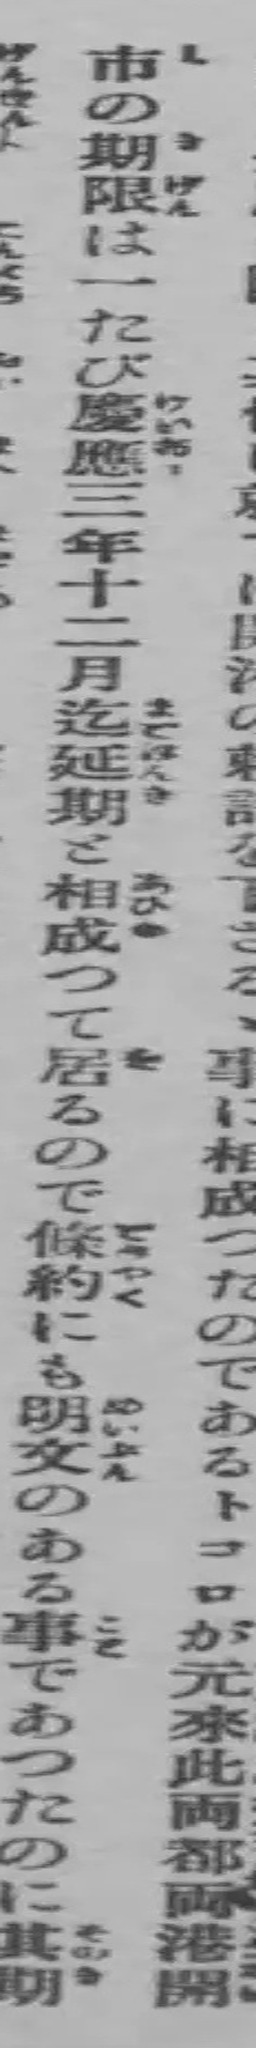市の期限は一たび慶応三年十二月迄延期と相成つて居るので条約にも明文のある事であつたのに其期
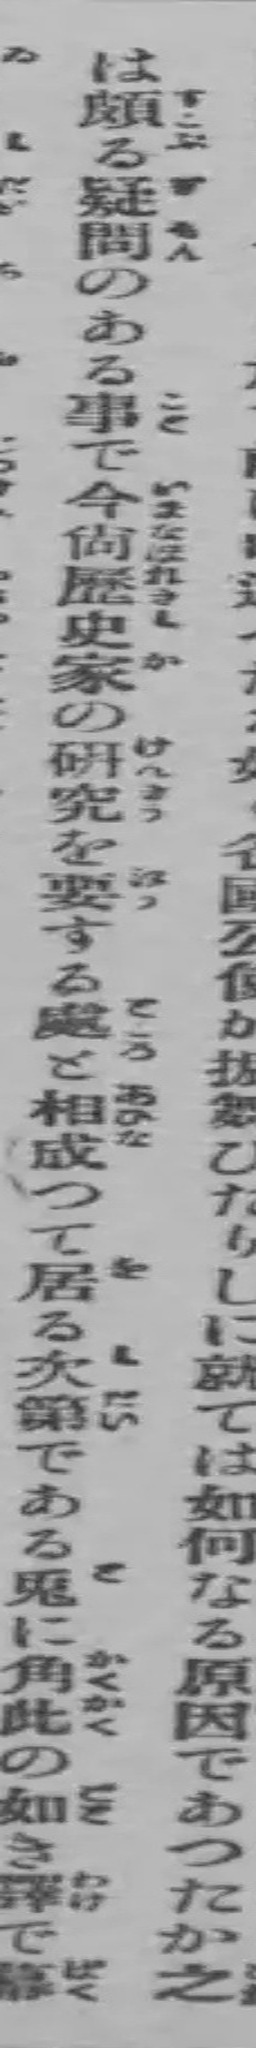は頗る疑問のある事で今尚歴史家の研究を要する処と相成つて居る次第である兎に角此の如き訳で幕
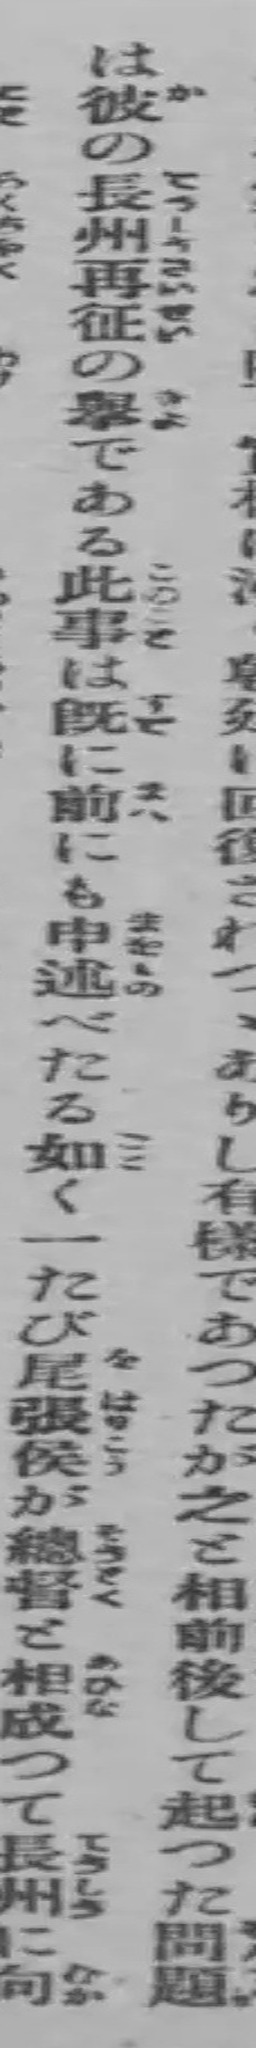は彼の長州再征の挙である此事は既に前にも申述べたる如く一たび尾張侯が総督と相成つて長州に向
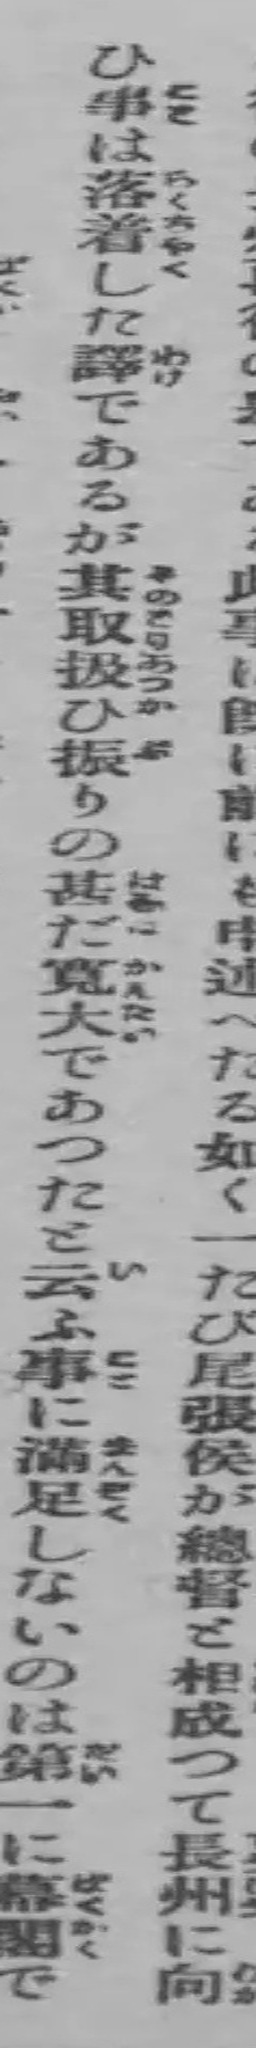ひ事は落着した訳であるが其取扱ひ振りの甚だ寛大であつたと云ふ事に満足しないのは第一に幕閣で
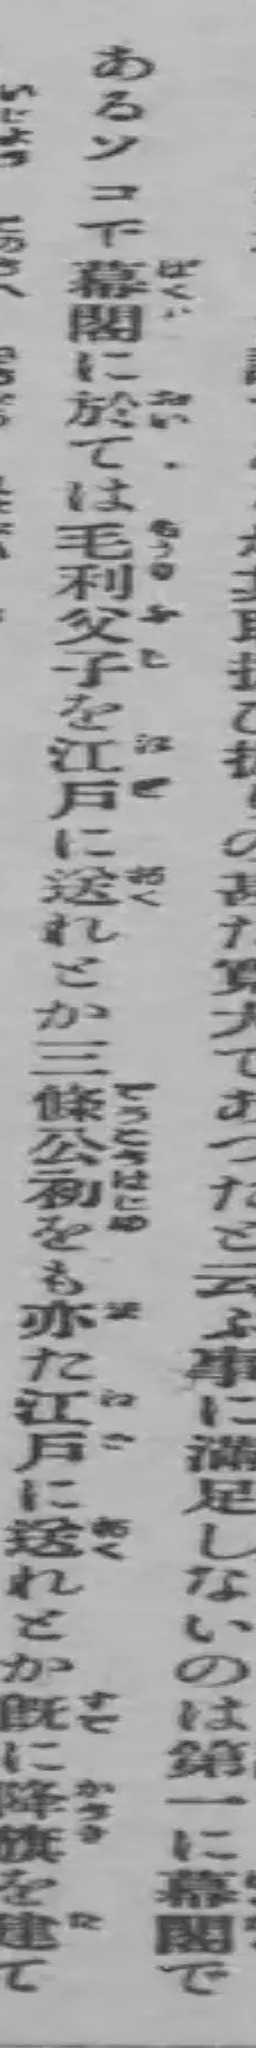あるソコで幕閣に於ては毛利父子を江戸に送れとか三条公初をも亦た江戸に送れとか既に降旗を建て
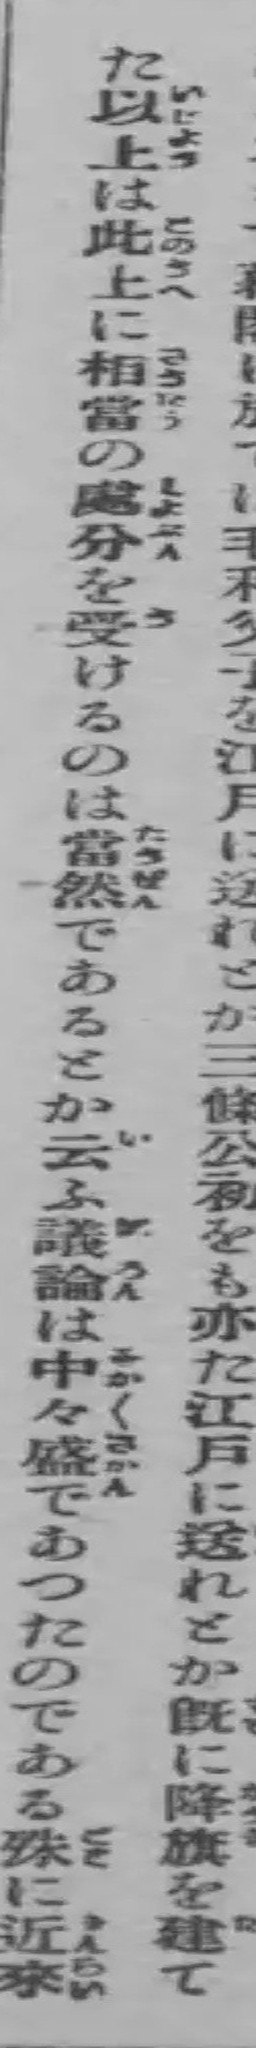た以上は此上に相当の処分を受けるのは当然であるとか云ふ議論は中々盛であつたのである殊に近来
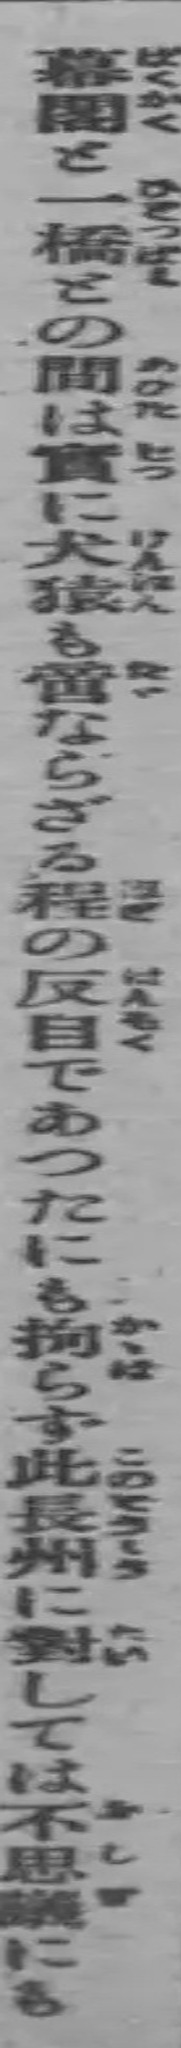幕閣と一橋との間は実に犬猿も啻ならざる程の反目であつたにも拘らず此長州に対しては不思議にも
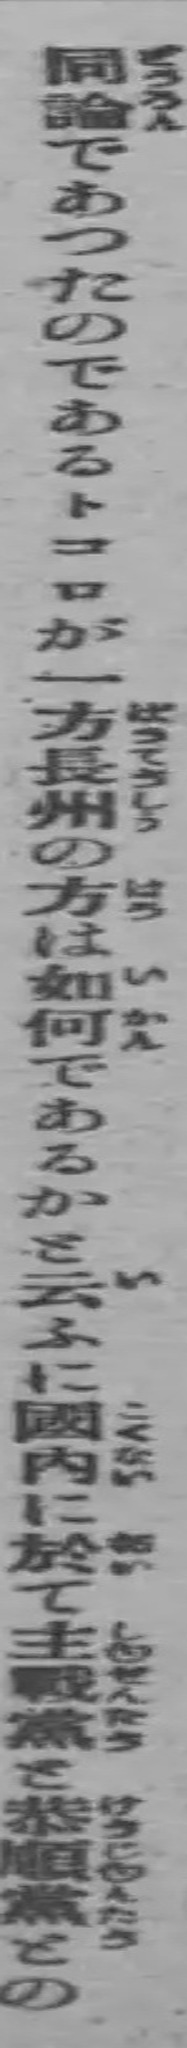同論であつたのであるトコロが一方長州の方は如何であるかと云ふに国内に於て主戦党と恭順党との
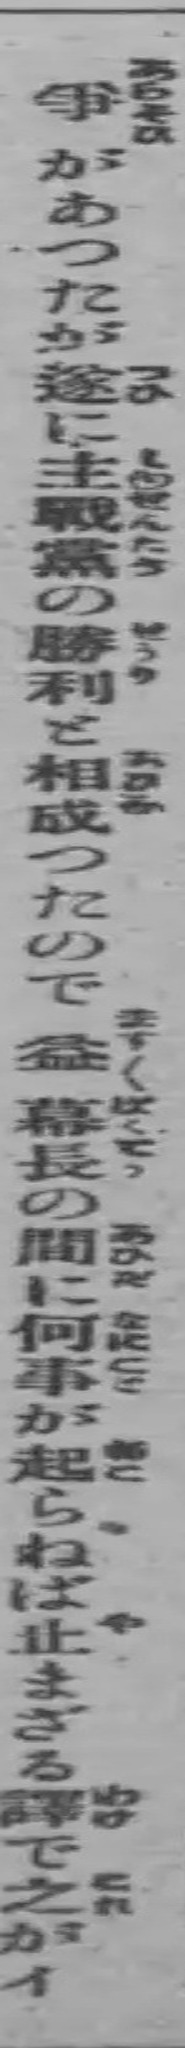争があつたが遂に主戦党の勝利と相成つたので益幕長の間に何事が起らねば止まざる訳で之がイ
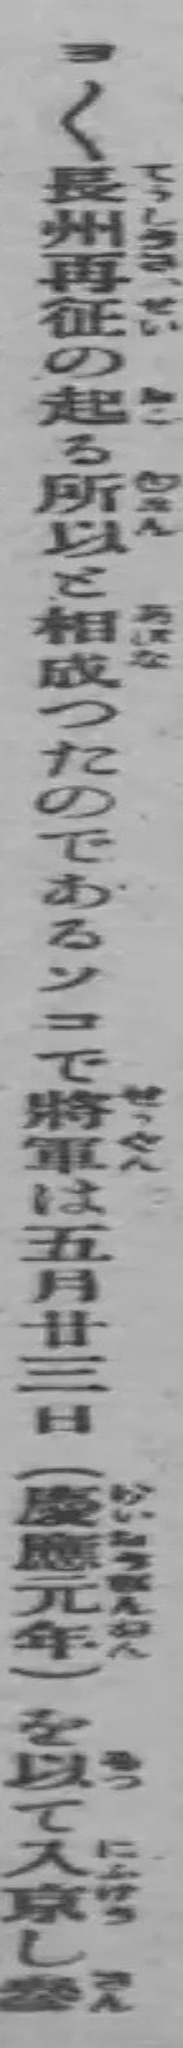ヨ〳〵長州再征の起る所以と相成つたのであるソコで将軍は五月廿三日(慶応元年)を以て入京し参
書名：豊橋市史談
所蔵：国立国会図書館 National Diet Library, JAPAN
